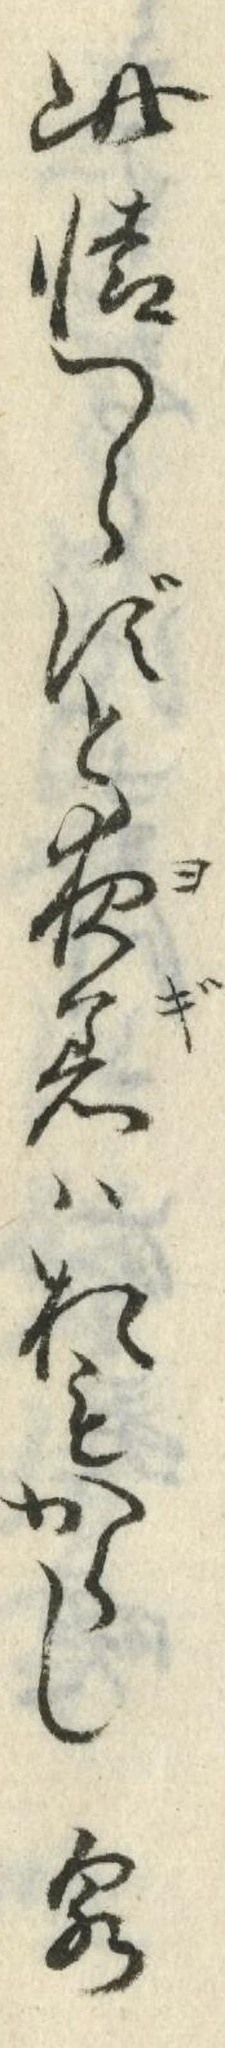此懐へらずと夜着はおもかろし泉
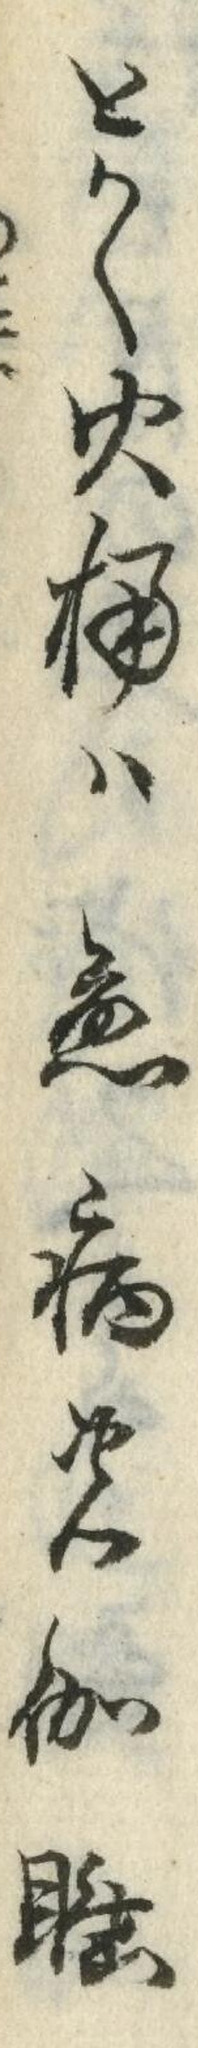とかく火桶は急病の枷睡

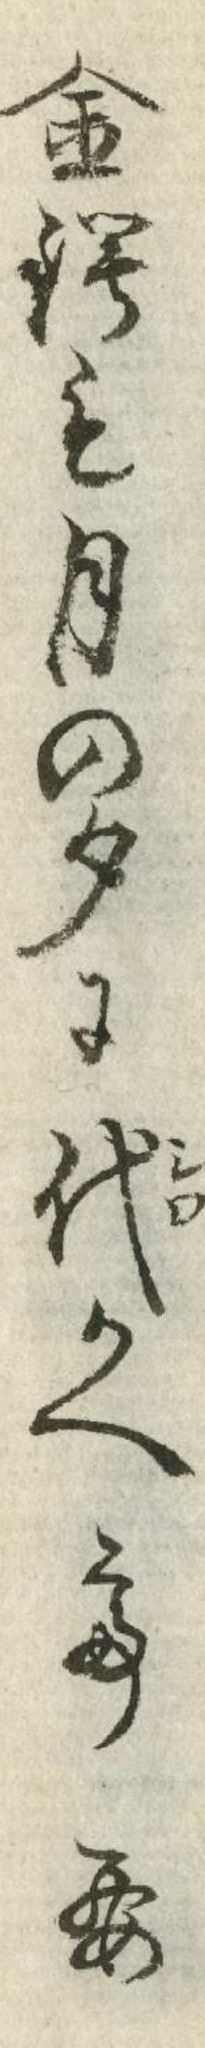金鍔も月の夕に代かへて要
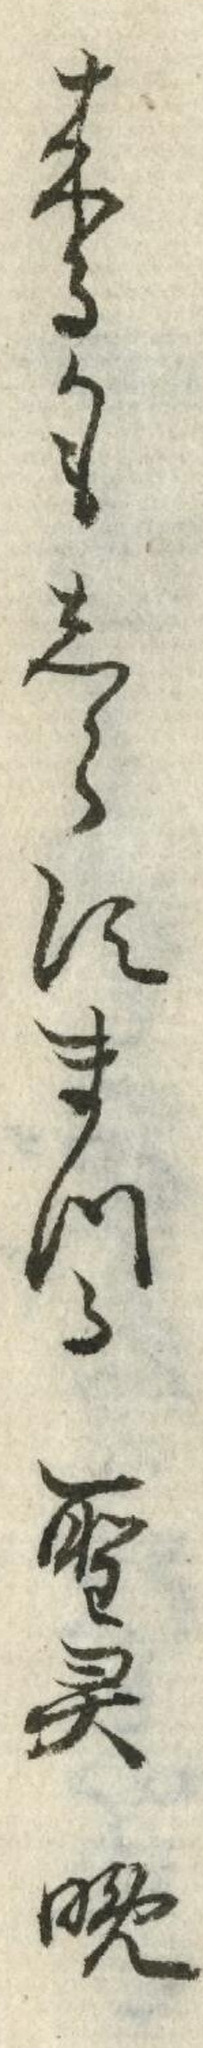来るかもしらすまつる聖霊晩
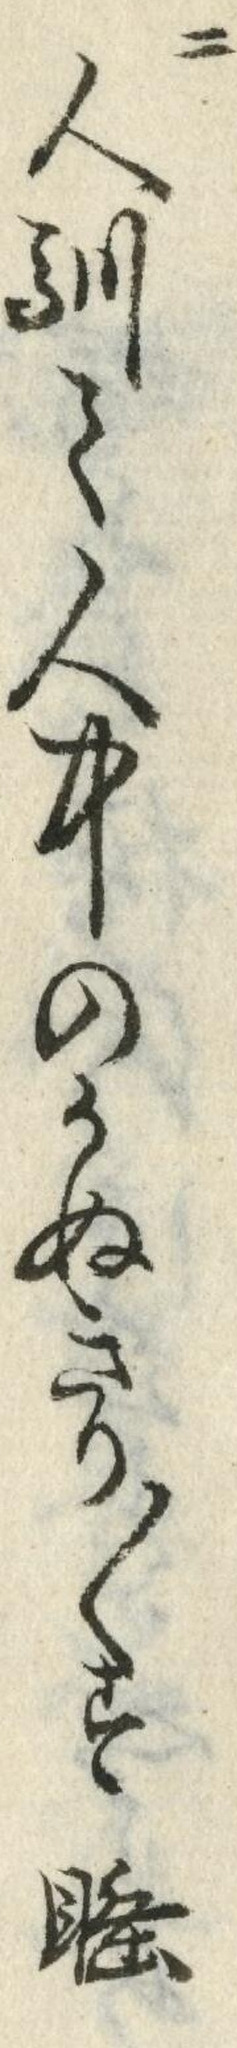人馴て人中のかぬきり〳〵す睡
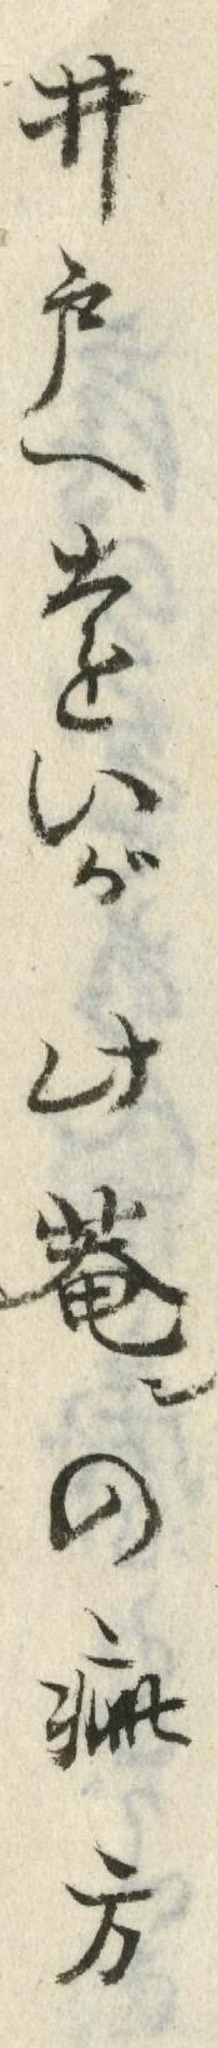井戸へ遠いが此庵ンの疵方
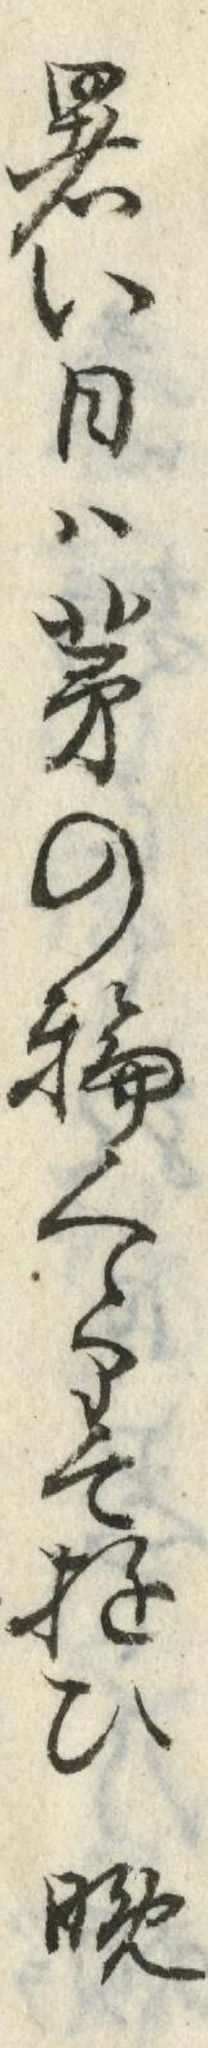暑い日は茅の輪くゝりて遊ひけり晩
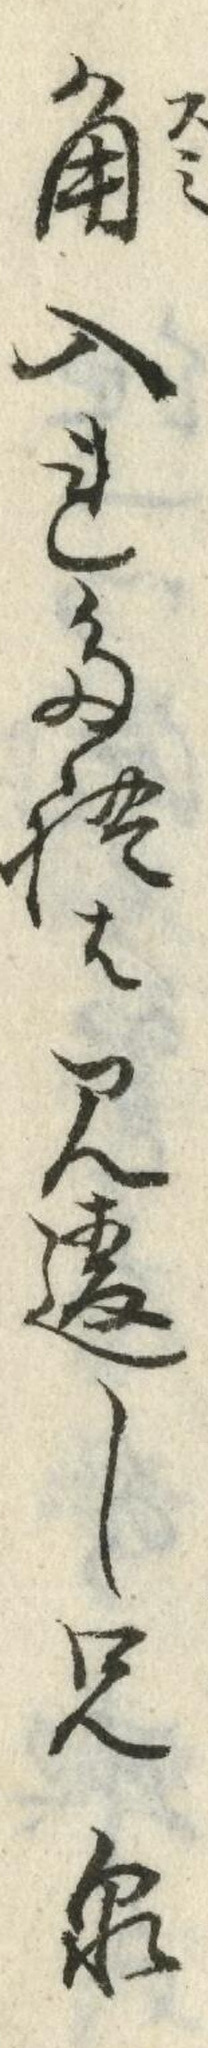角入れたれは見違し兄泉
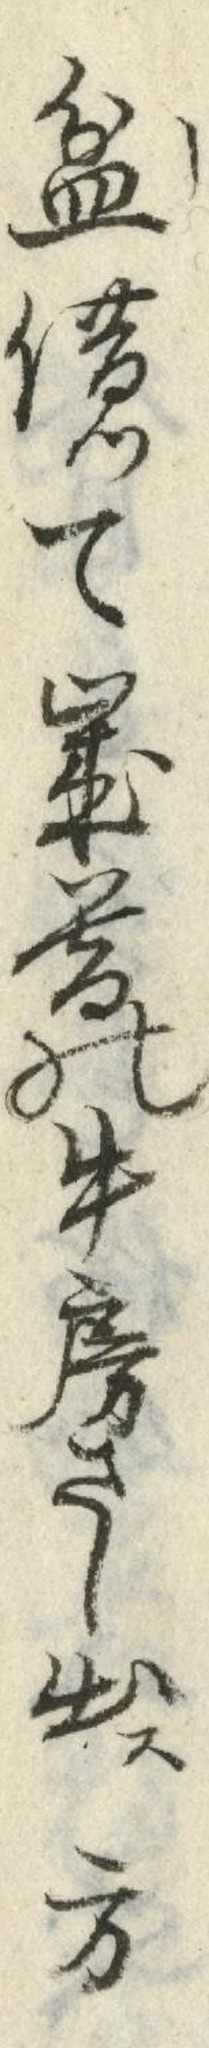盆借ツて歳暮の牛房差し出ス方
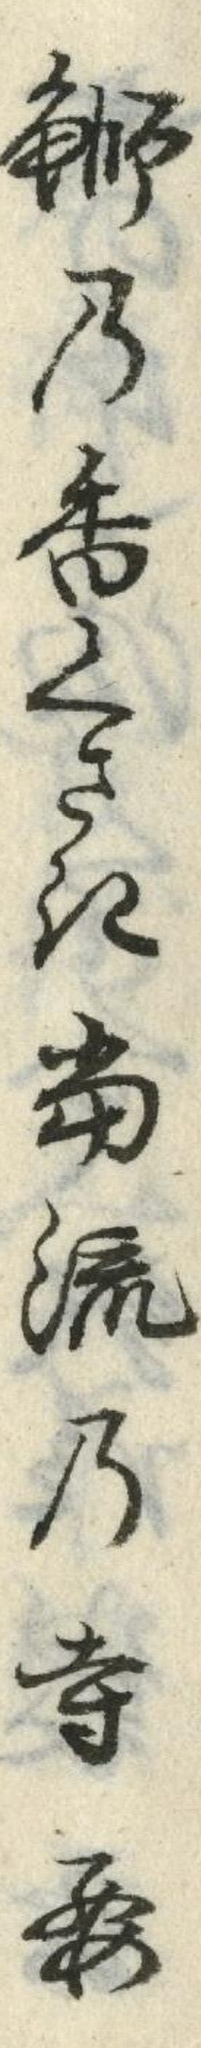鰤の香くさき当流の寺要
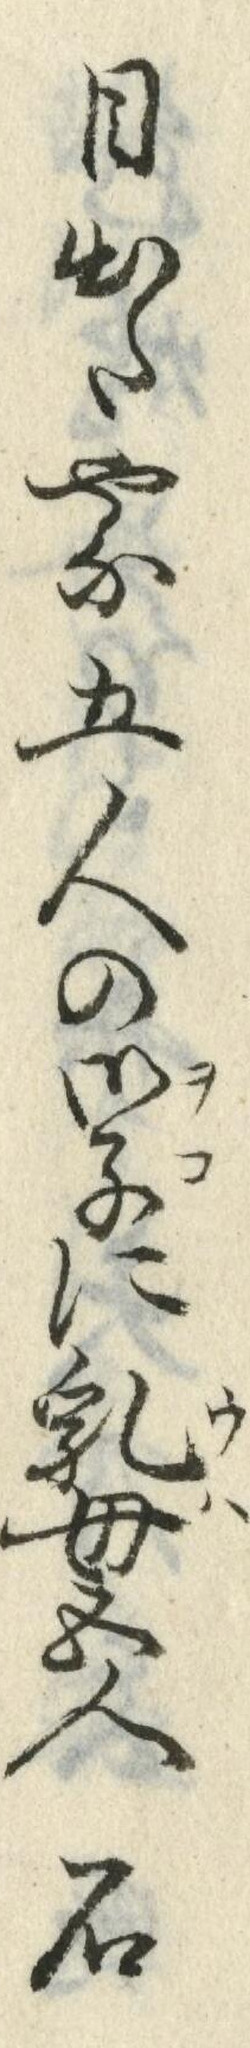目出たやな五人の御子に乳母五人石
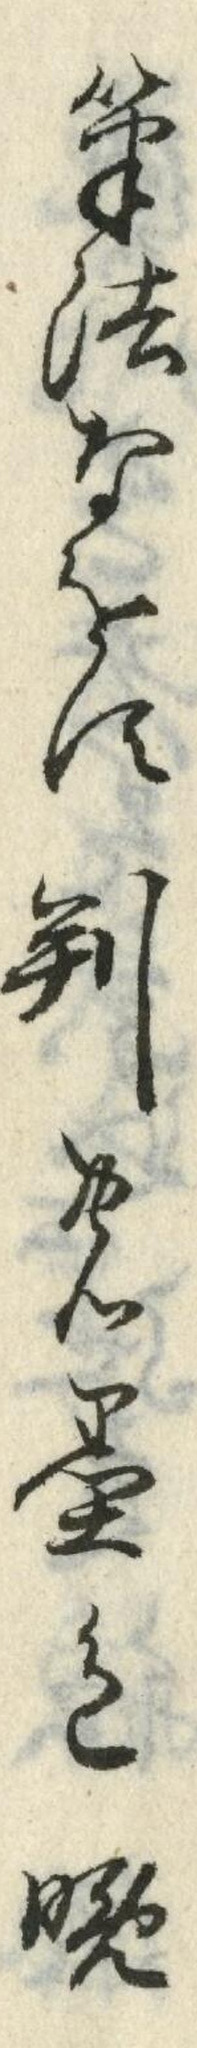筆法なをす判の墨色晩
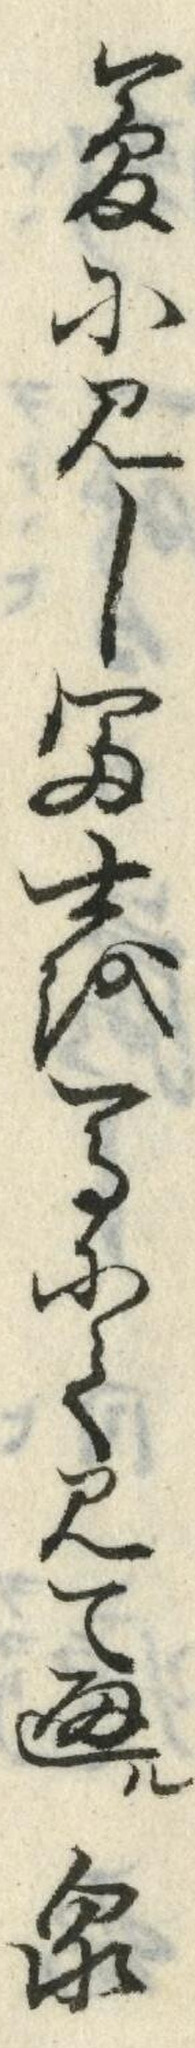夢に見し富士を馬にて見て通ル泉
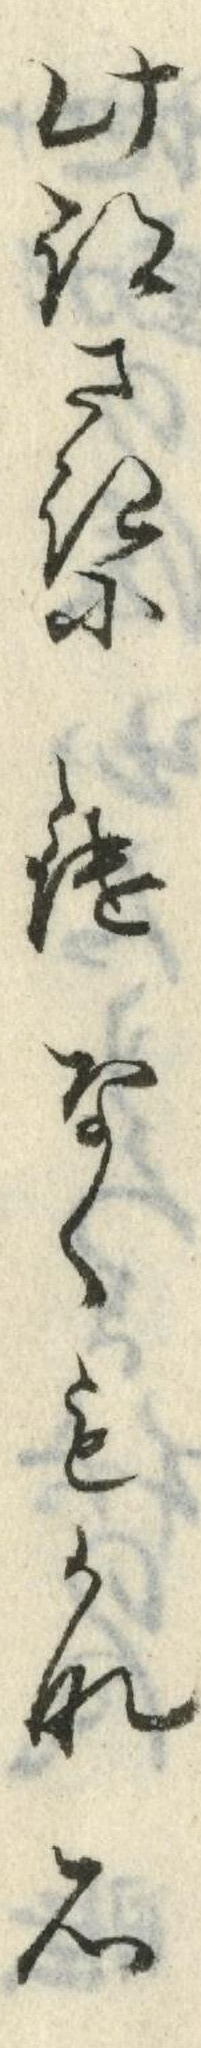此跡さきに銭なくもかな石
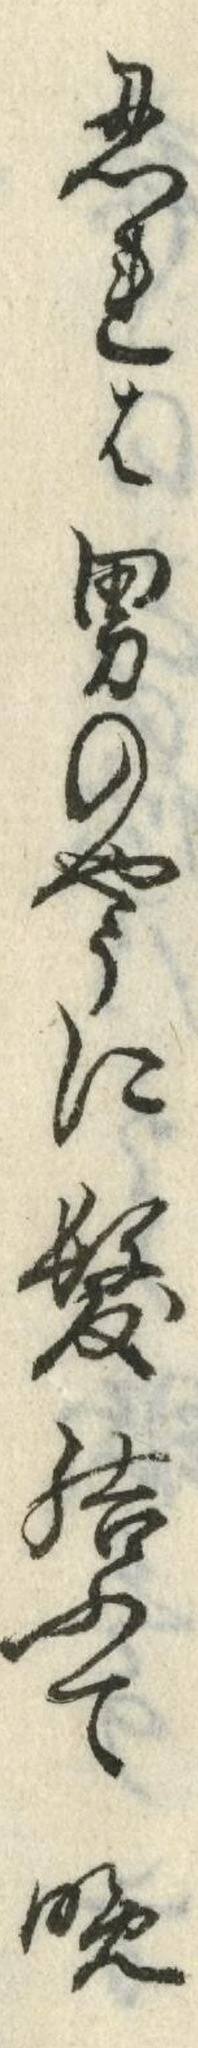忍れは男のやうに髪結ふて晩

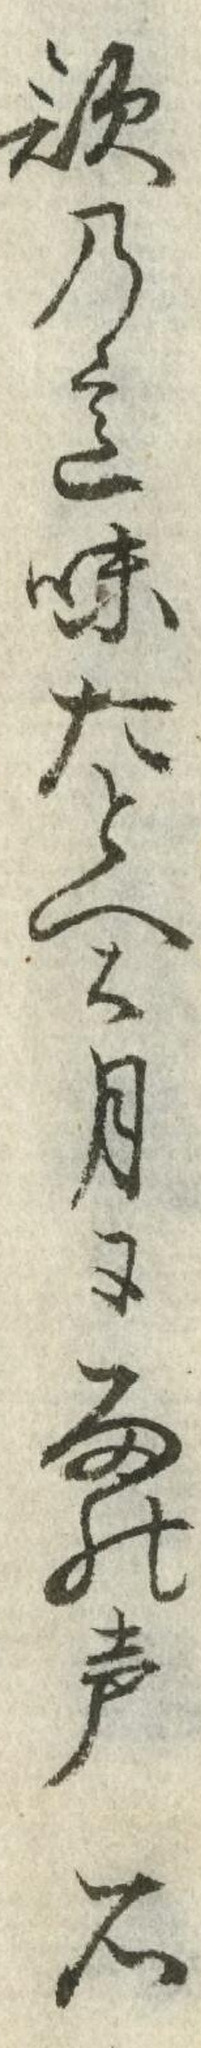歌の意味たとへは月に雨の声石
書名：誹諧　能登釜
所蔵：Ishikawa Prefectural Library
